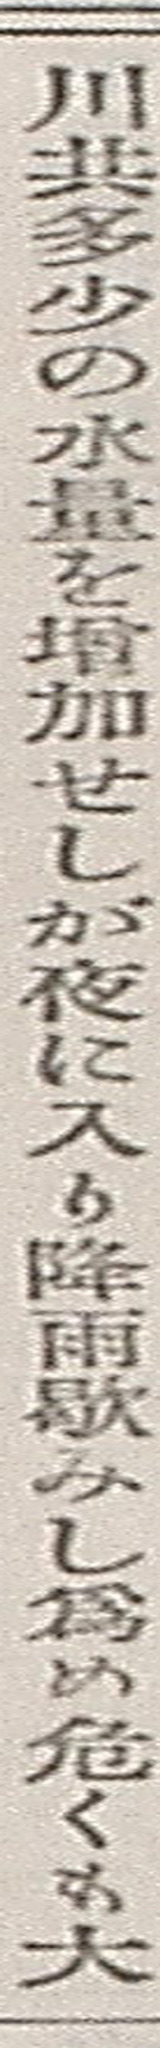川とも多少の水量を増加せしが夜に入り降雨歇みし為め危くも大
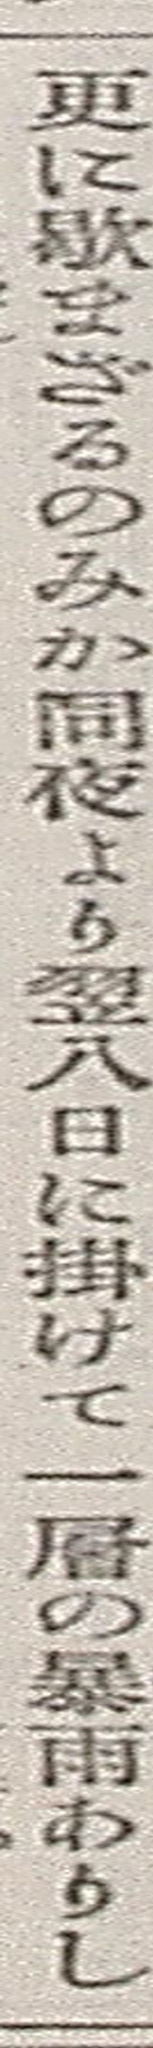更に歇まざるのみか同夜より翌八日に掛けて一層の暴雨ありし
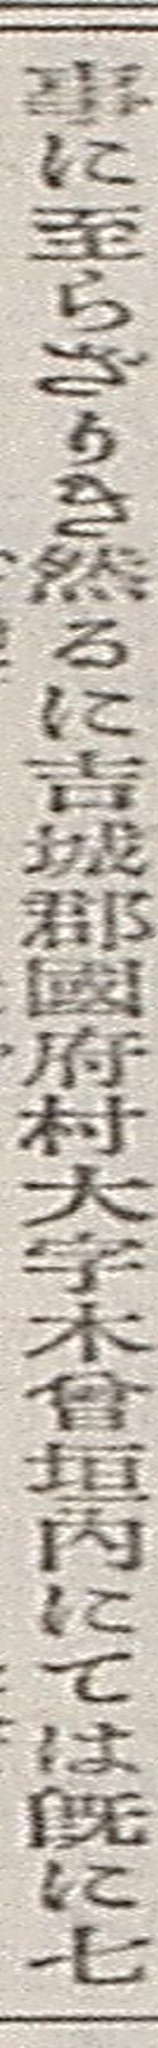事に至らざりき然るに吉城郡国府村大字木曽垣内にては既に七
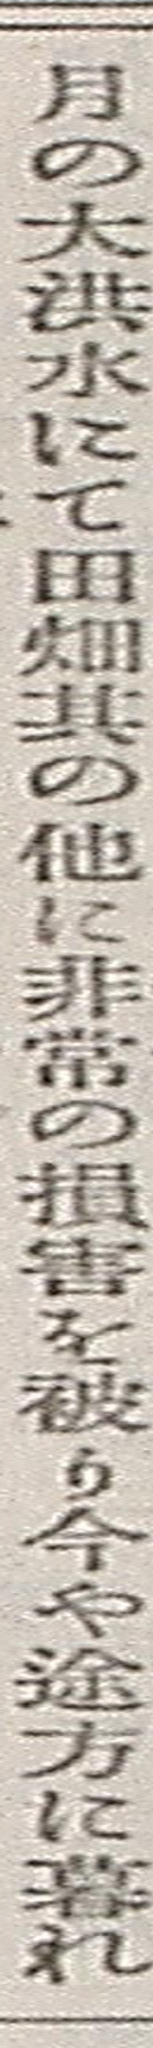月の大洪水にて田畑其の他に非常の損害を被り今や途方に暮れ
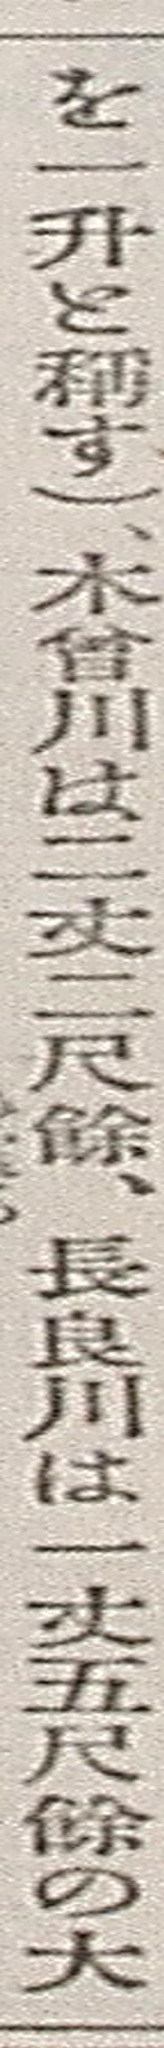を一升と称す）木曽川は二丈二尺餘、長良川は一丈五尺餘の大
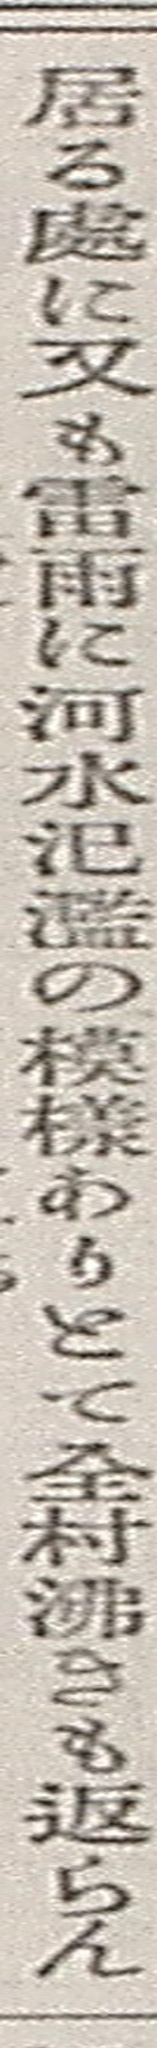居る処に叉も雷雨に河水氾濫の模様ありとて全村沸きも返らん
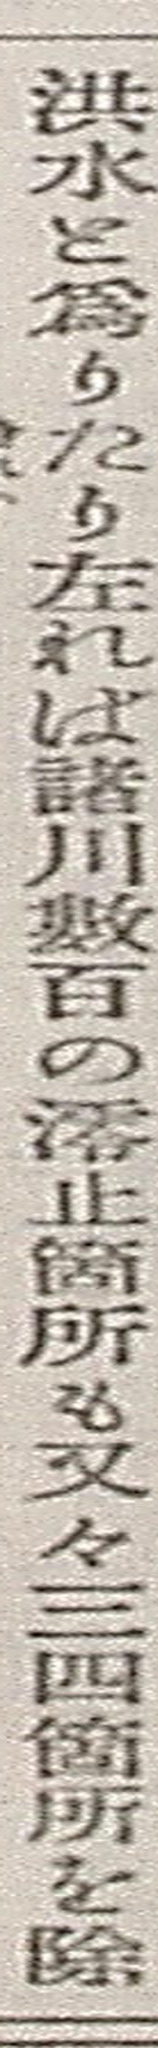洪水と為りたり左すれば諸川数百の澪止箇所も又々三四箇所を除
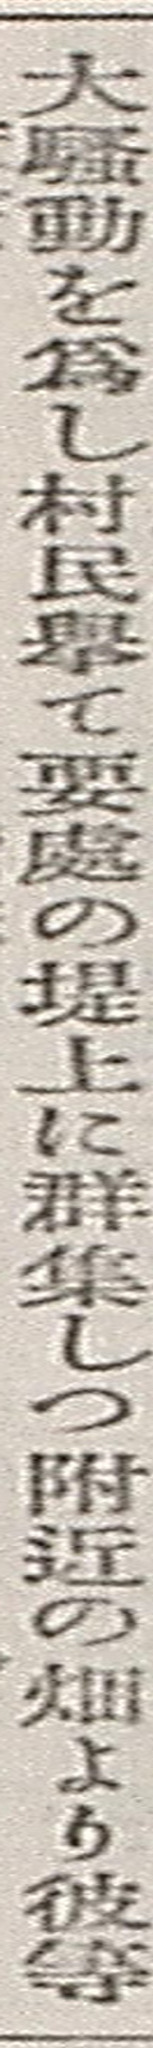大騒動を為し村民挙て要処の堤上に群集しつ附近の畑より彼等
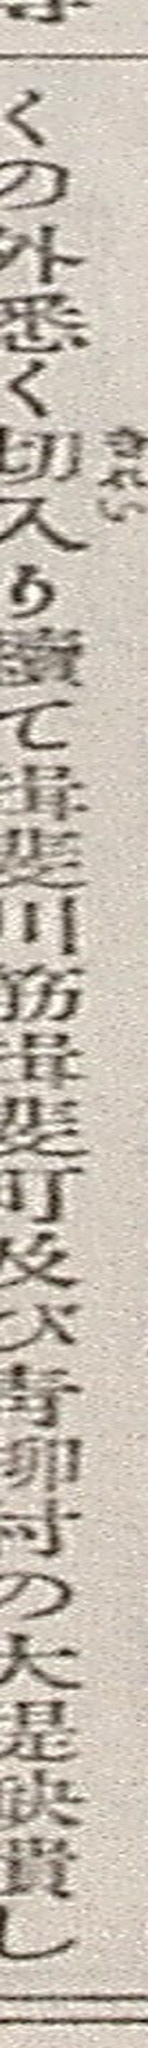くの外悉く切入り続て揖斐川筋揖斐町及び青柳村の大堤决潰し
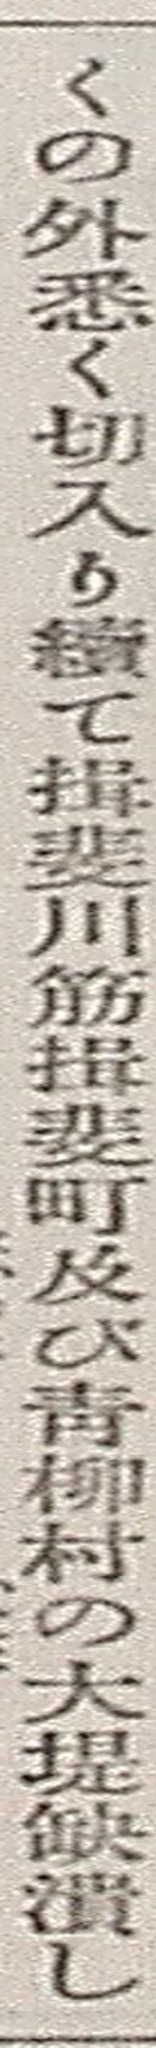くの外悉く切入り続て揖斐川筋揖斐町及び青柳村の大堤决潰し
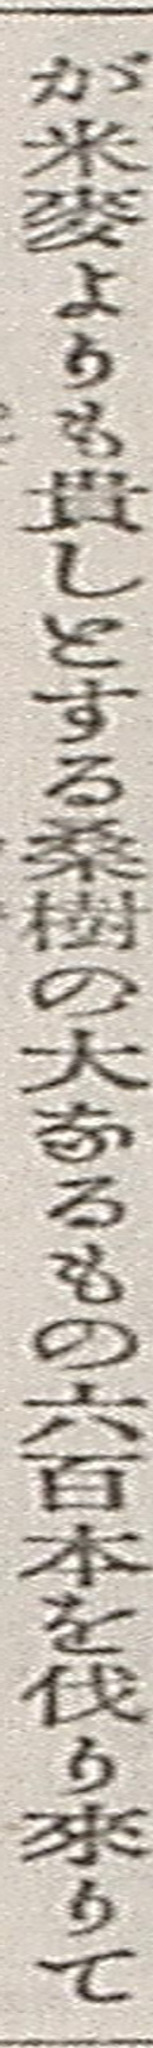が米麦よりも貴しとする桑樹の大なるもの六百本を伐り来りて
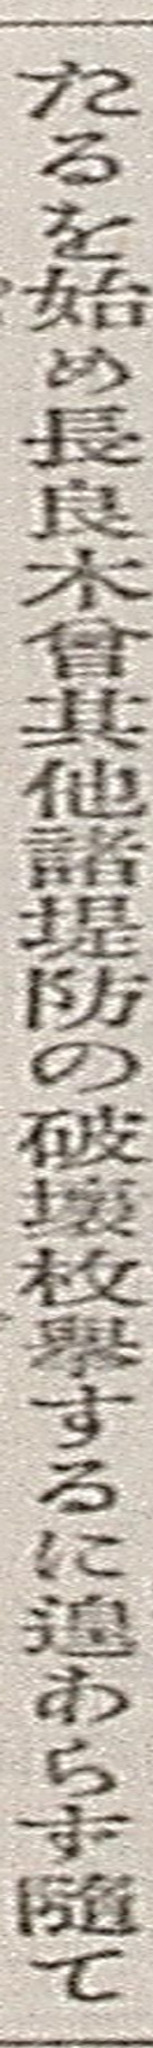したるを始め長良木曽其他諸堤防の破壊枚挙するに遑あらず随て
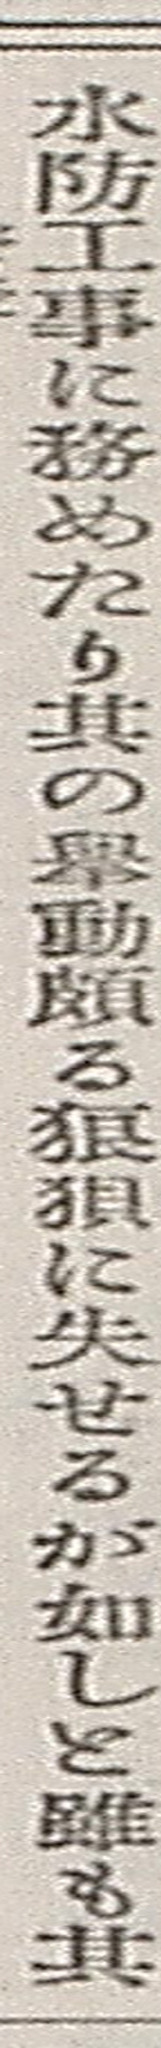水防工事に務めたり其の挙動頗る狼狽に失せるが如しと雖も其
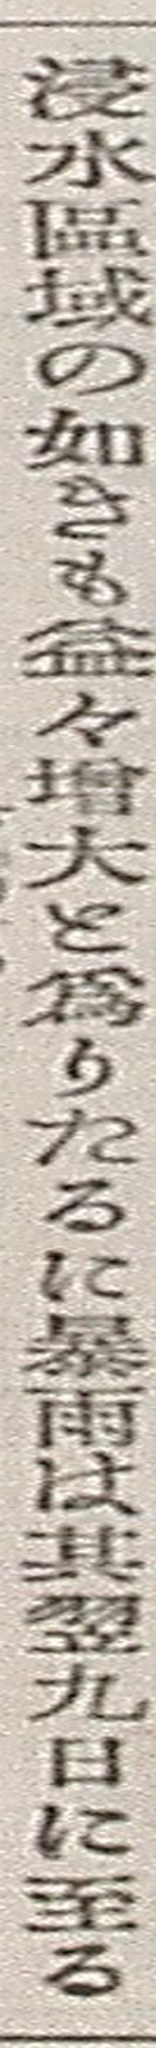浸水区域の如きも益々増大とと為りたるに暴雨は其翌九日に至る
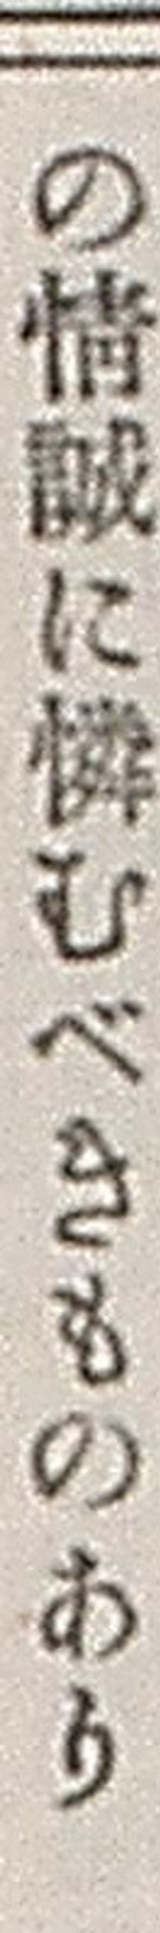の情誠に憐むべきものなり
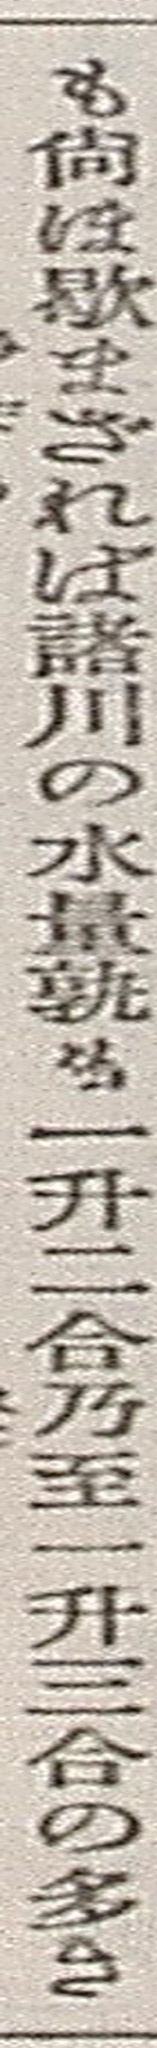も尚ほ歇まざれば諸川の水量孰も一升二合乃至一升三合の多き
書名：風俗畫報臨時増刊第百二十六號　洪水被害録（中）
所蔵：東京大学地震研究所図書室 Earthquake Research Institute Library, The University of Tokyo, JAPAN
